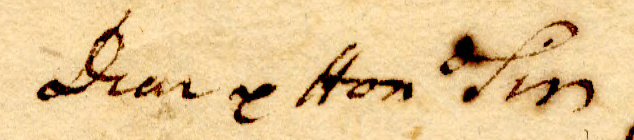Dear & Hon Sir
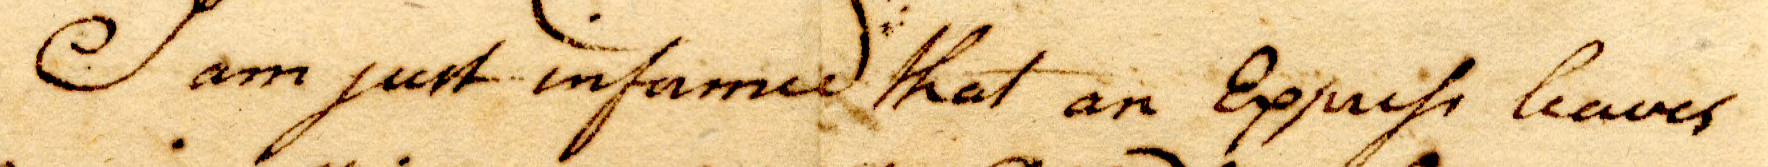I am just informed that an Express leaves
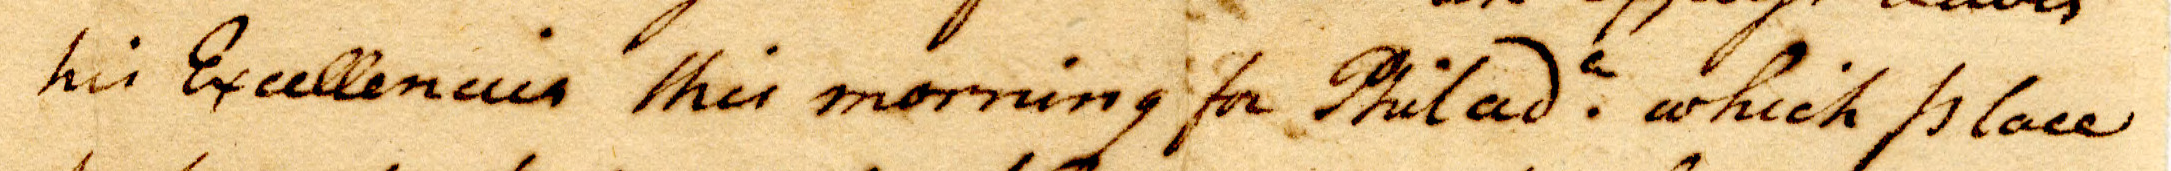his Excellencies this morning for Philad^a. which place
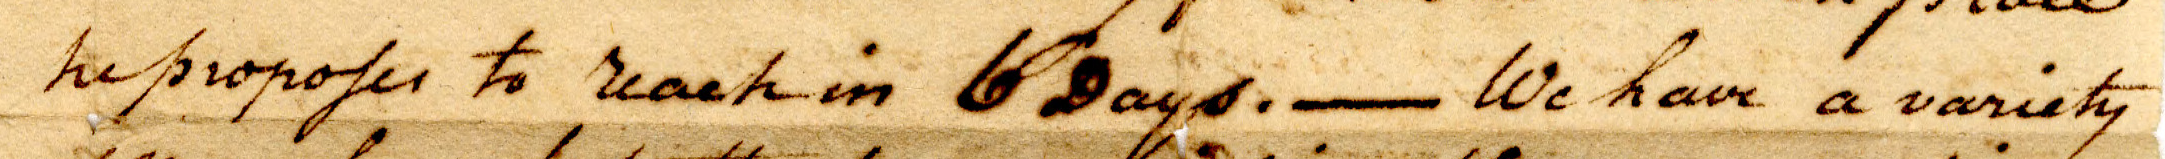he proposes to reach in 6 Days.- We have a variety
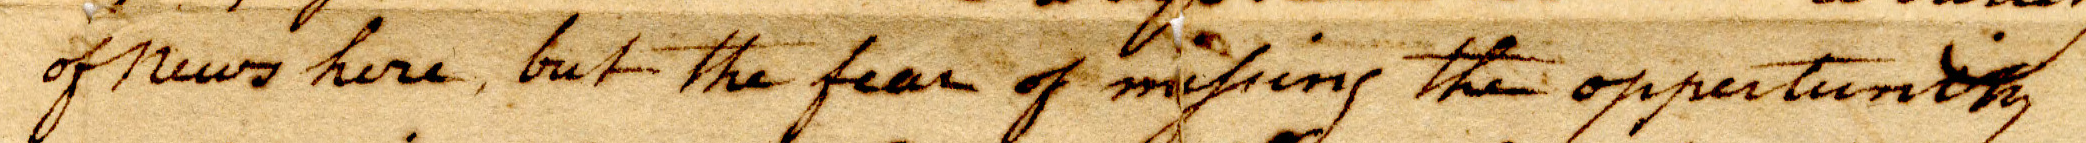of news here, but the fear of missing the oppertunity
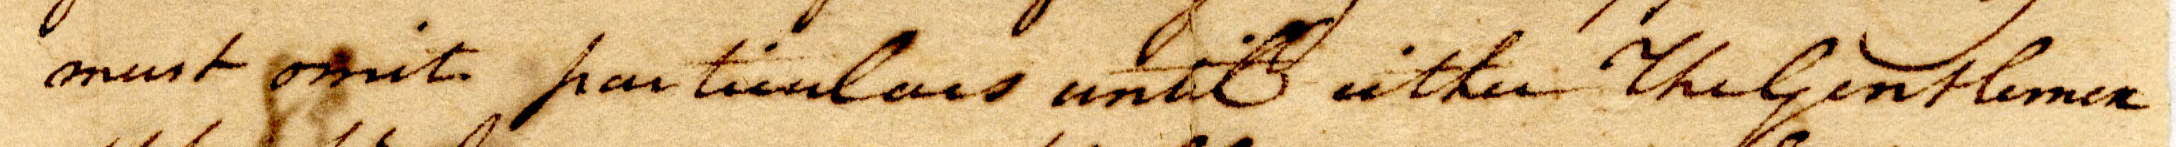must omit particulars until wither The Gentlemen
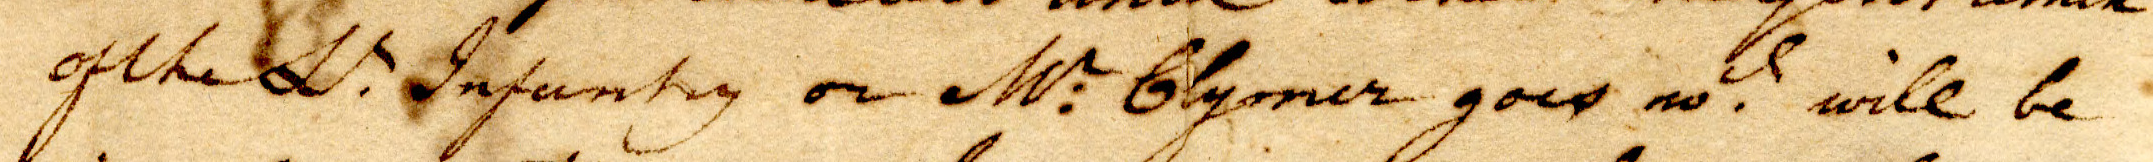of the S. Infantry or M^r: Clymer goes w^ch. will be
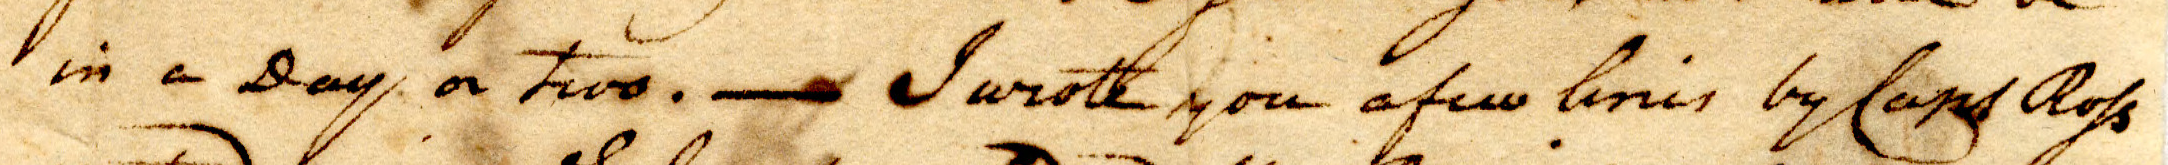in a Day or two.- I wrote you a few lines by Capt Ross
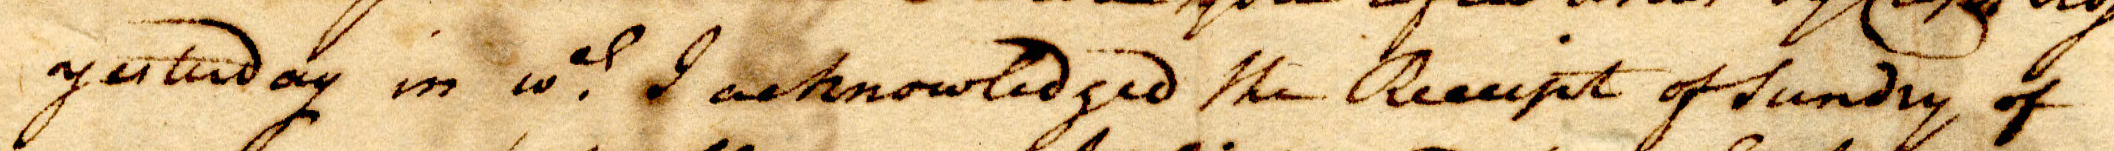yesterday in w^ch. I acknowledged the Receipt of sundry of
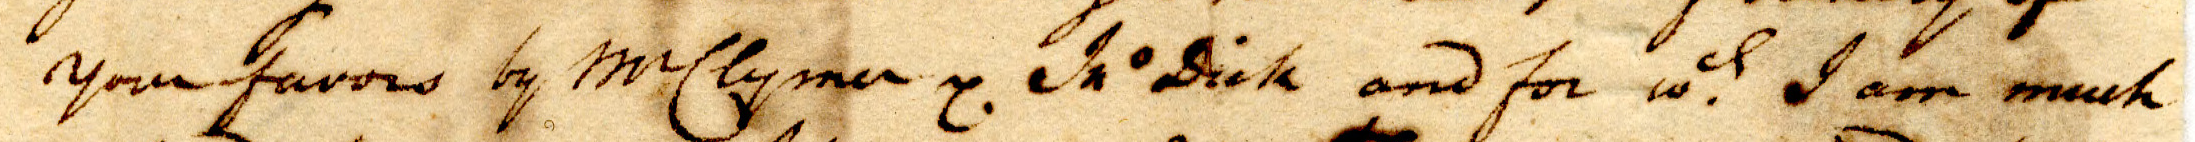your favors by M^r Clymer & Jn^o Dick and for w^ch. I am much
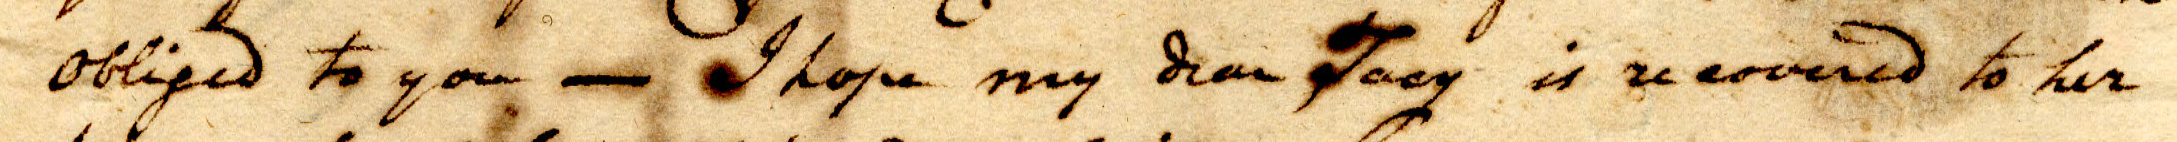obliged to you- I hope my dear Jacy is recovered to her
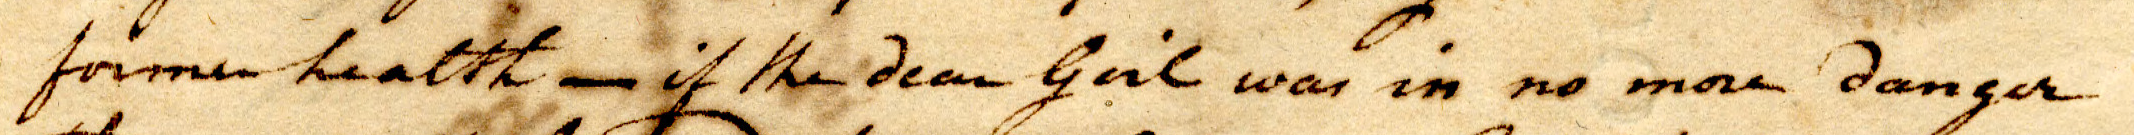former health- if the dear Girl was in no more danger
